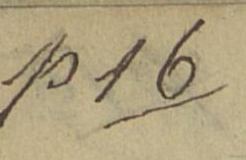p 16
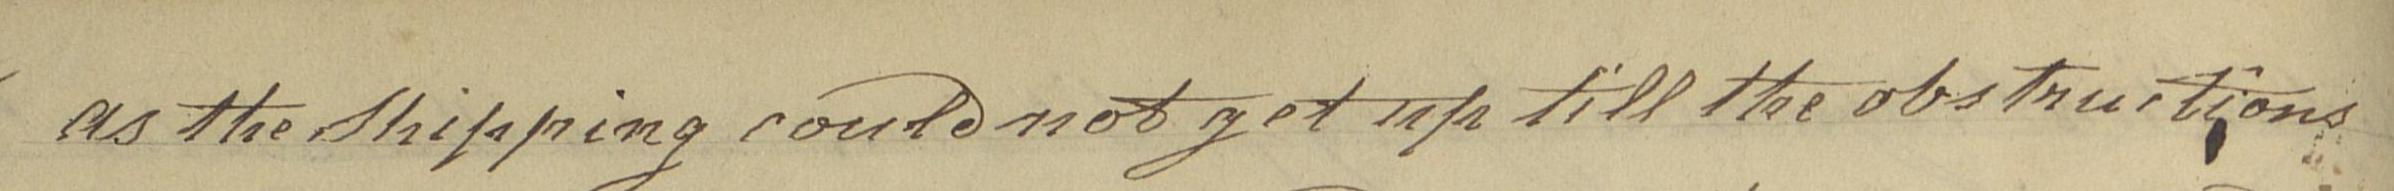as the shipping could not get up till the obstructions
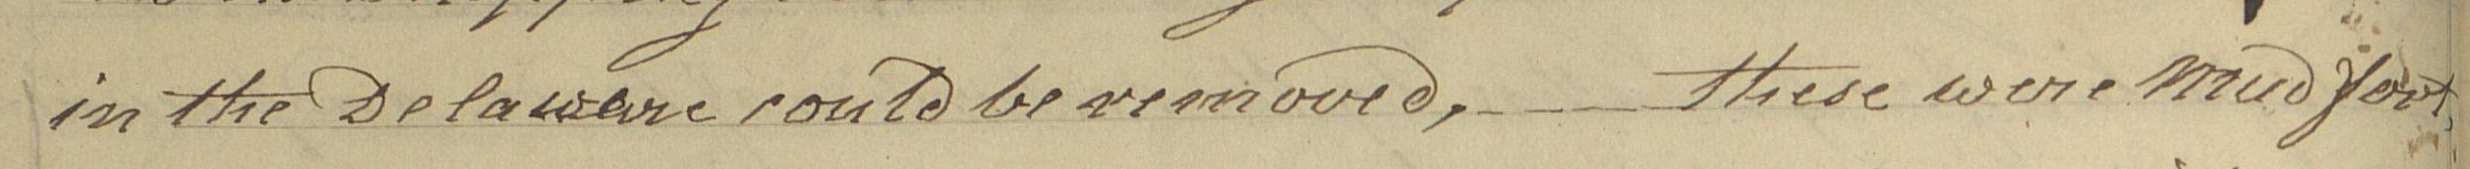in the Delaware could be removed, these were Mud fort
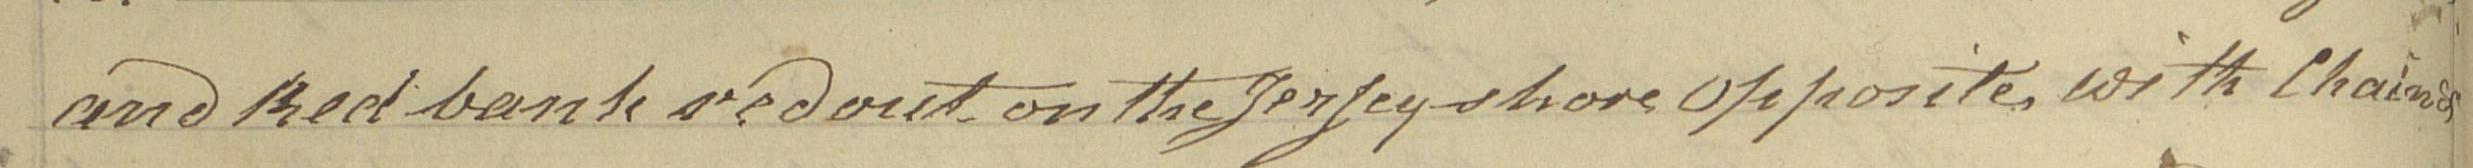and Red bank redout on the Jersey shore opposite, with Chain
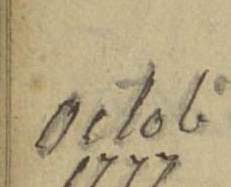Octob
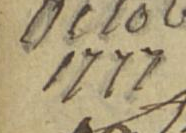1777
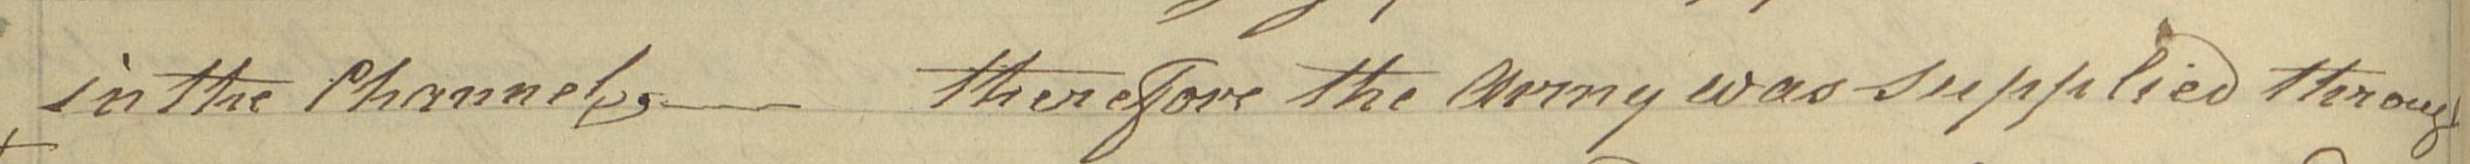in the Channels. Therefore the Army was supplied through
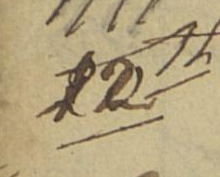12^th
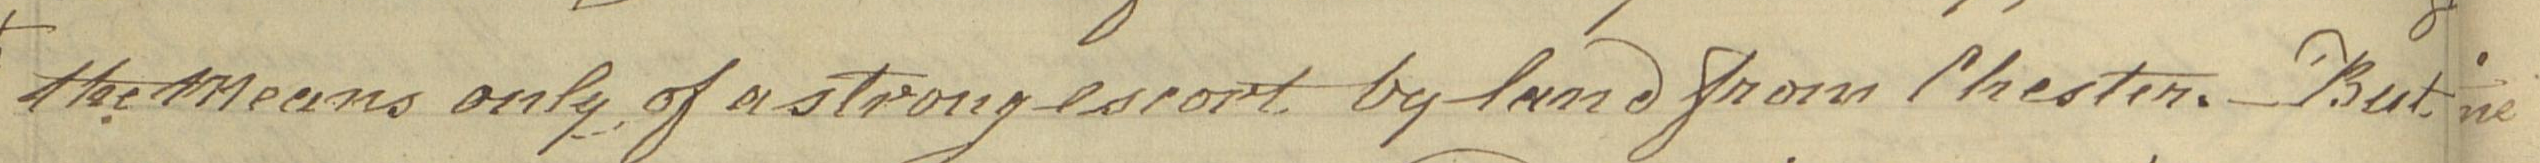the Means only of a strong escort by land from Chester. But
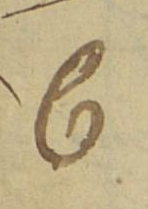C
